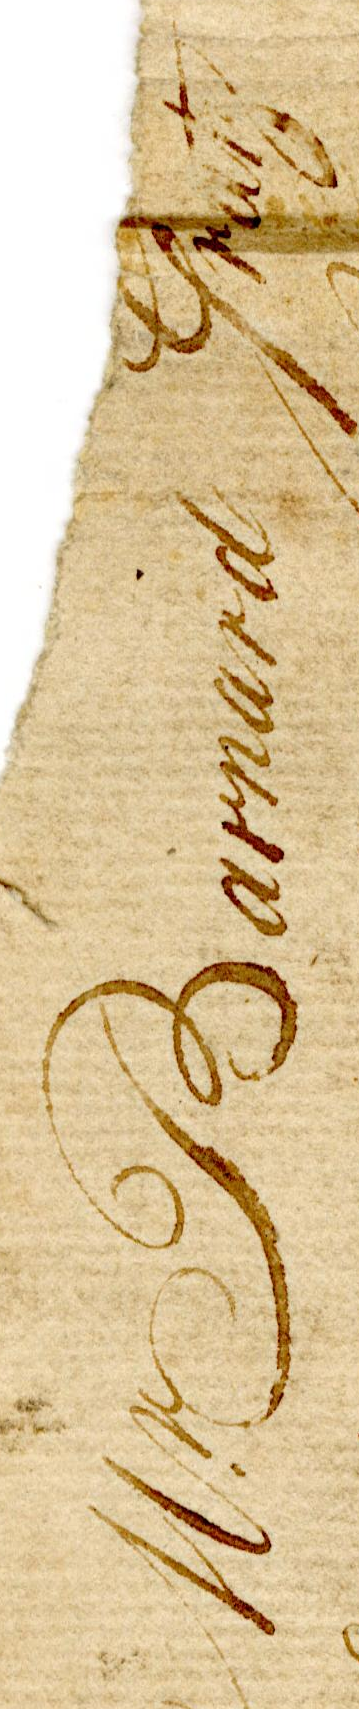M^r Barnard Gratz
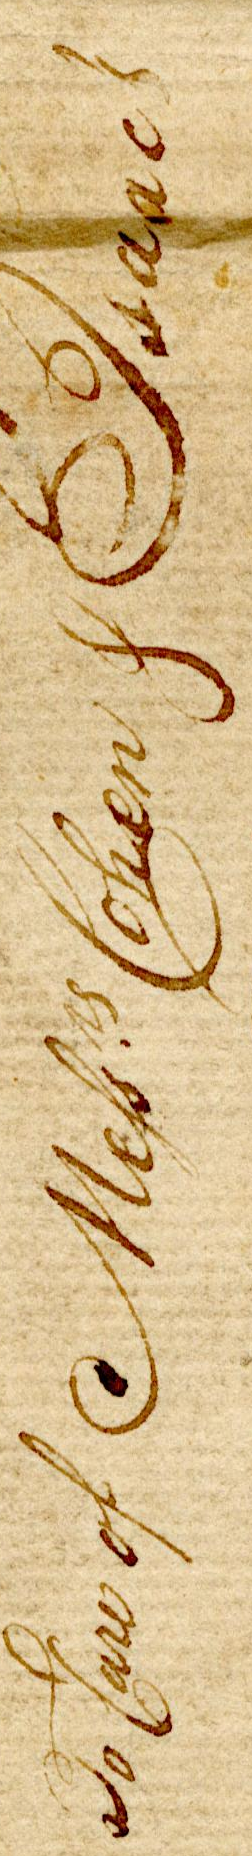In care of Mess^rs Cohen & Isaac
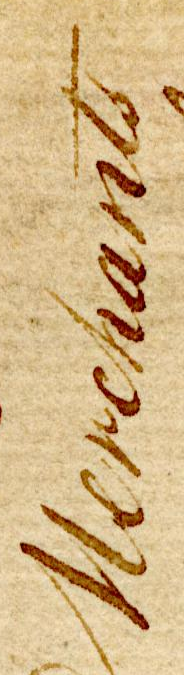Merchants
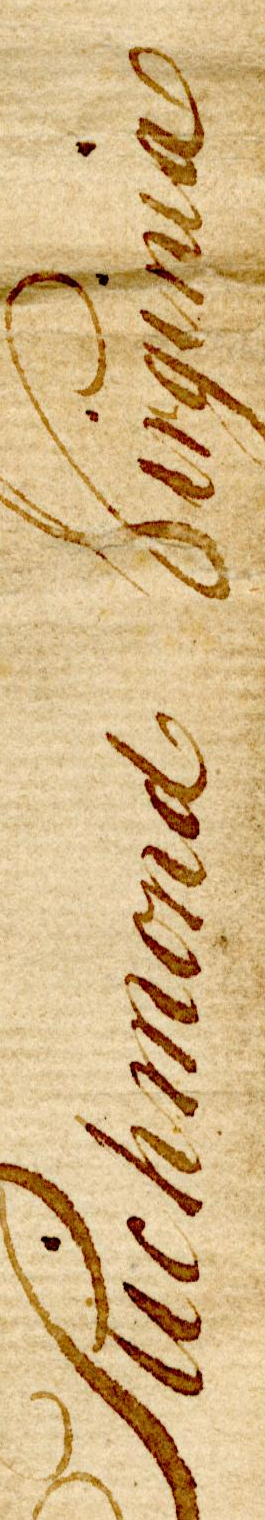Richmond Virginia
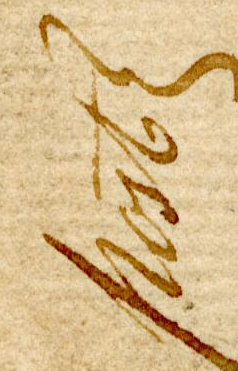Post
